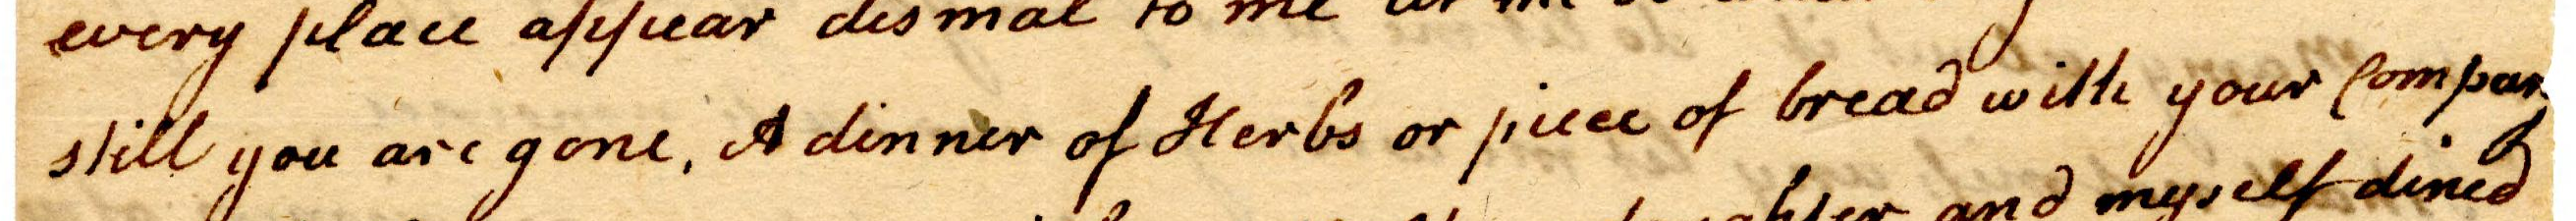still you are gone. A dinner of Herbs or piece of bread with your Company
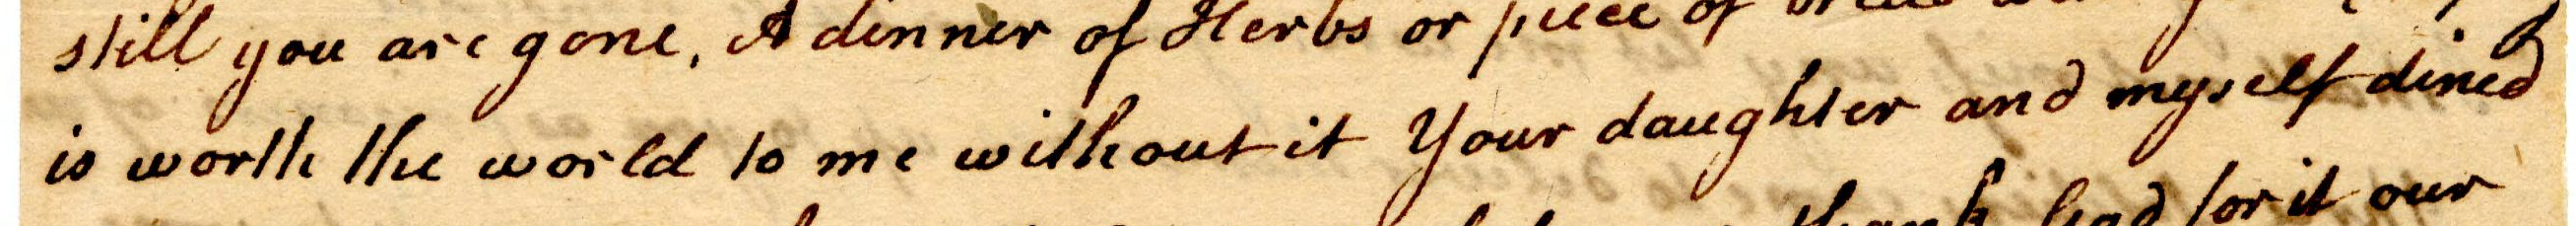is worth the world to me without it Your daughter and myself dined
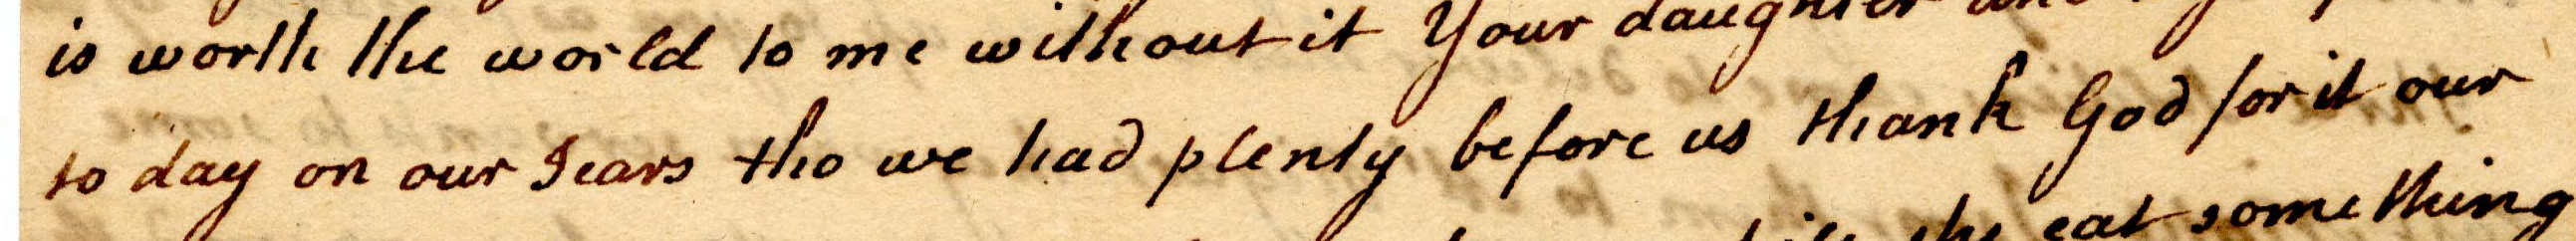to day on our Tears tho we had plenty before us thank God for it our
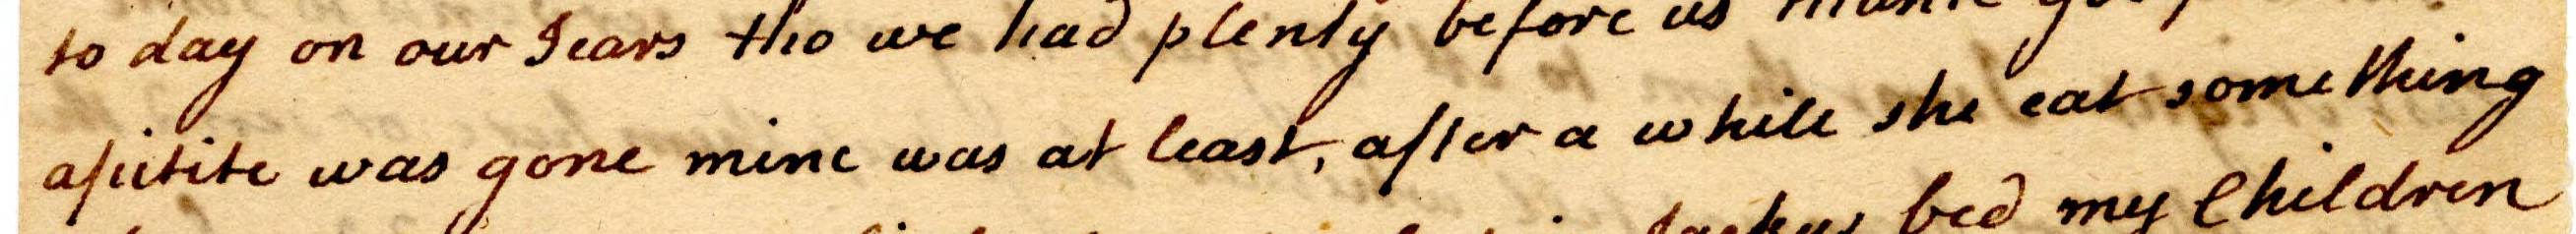apitite was gone mine was at least, after a while she eat some thing
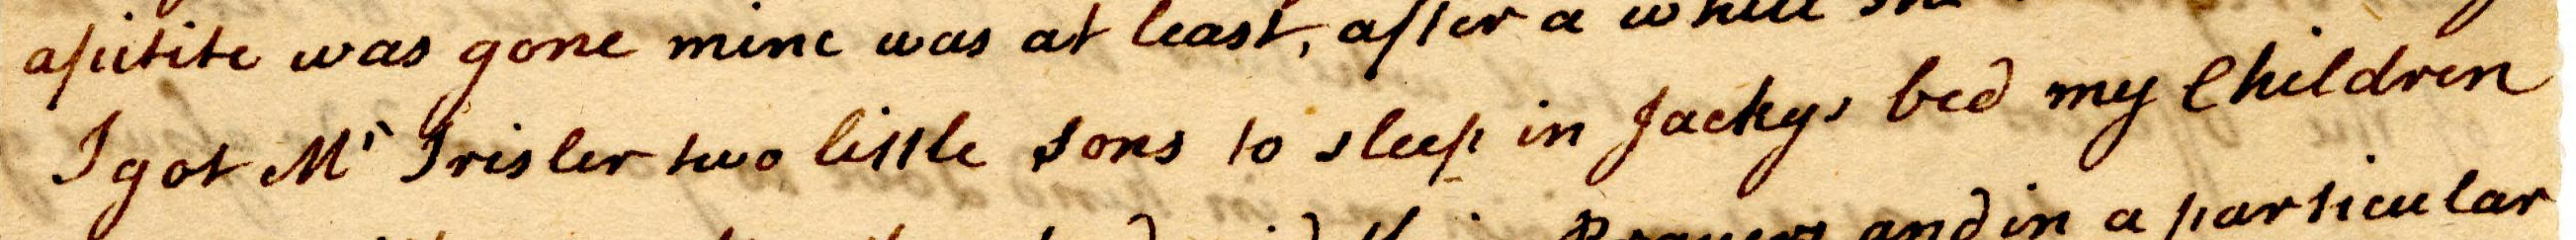I got M^r Trisler two little sons to sleep in Jackys bed my Children
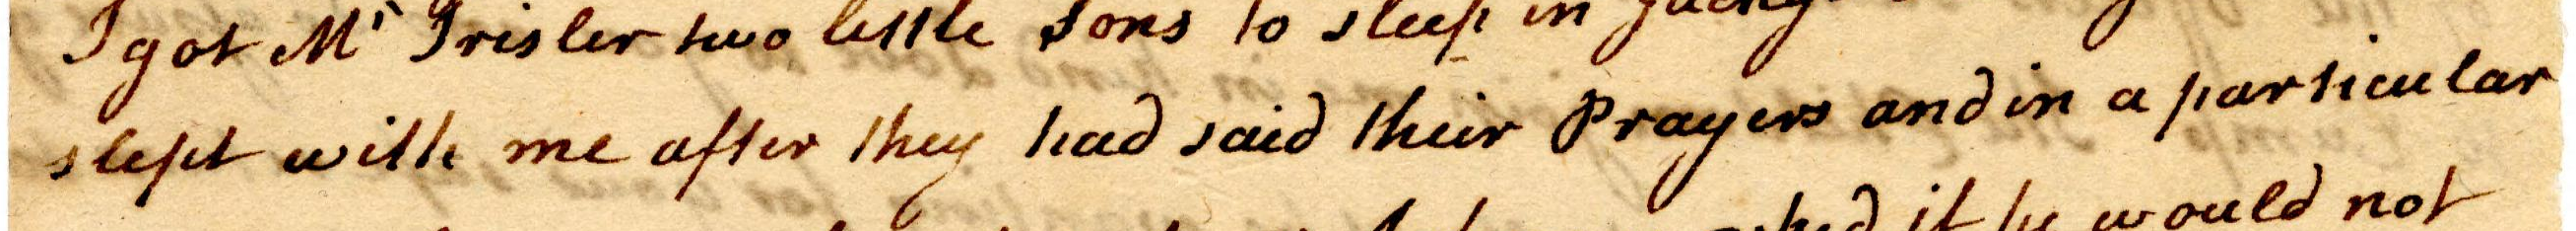slept with me after they had said their Prayers and in a particular
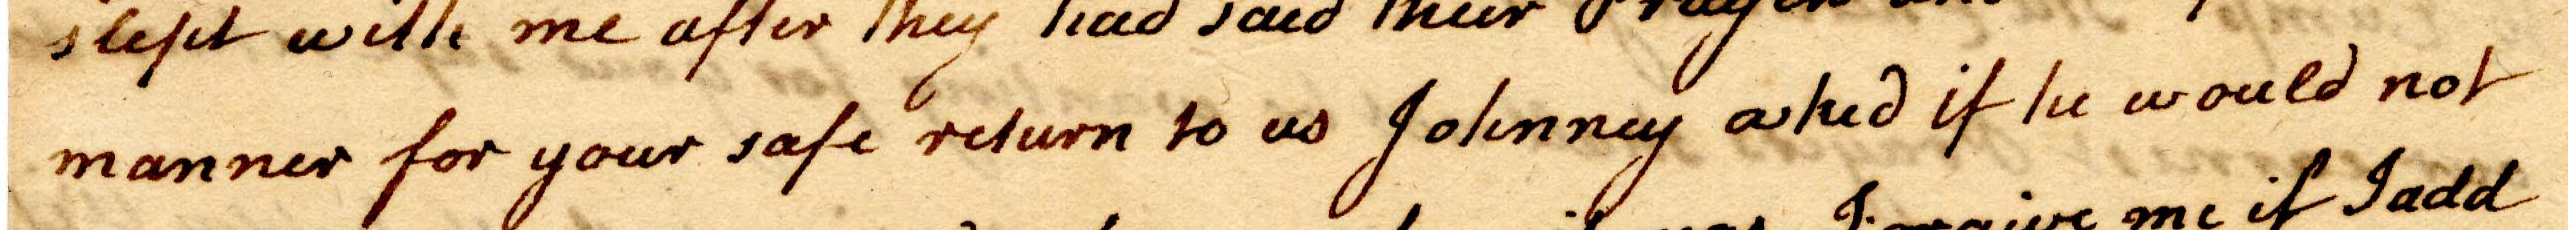manner for your safe return to us Johnney asked if he would not
